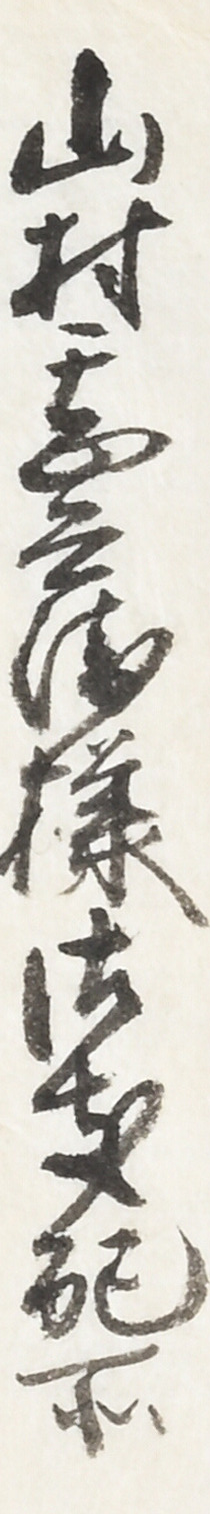山村甚兵衛様御支配所
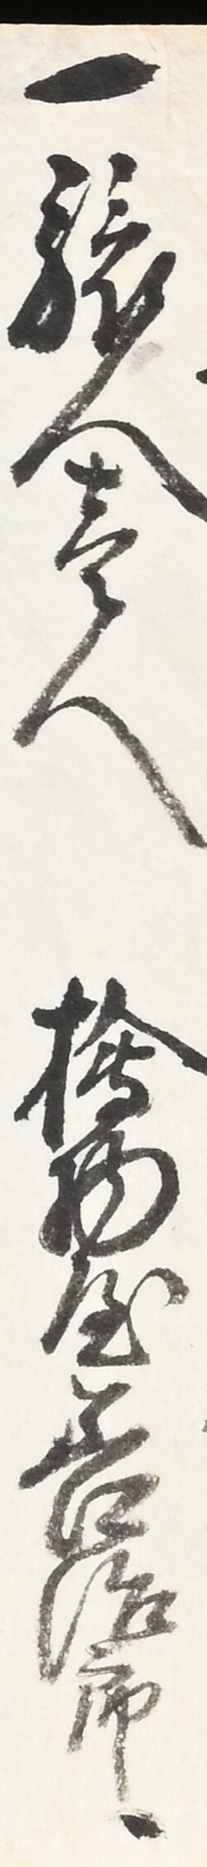一旅人壱人檜物屋善治郎・
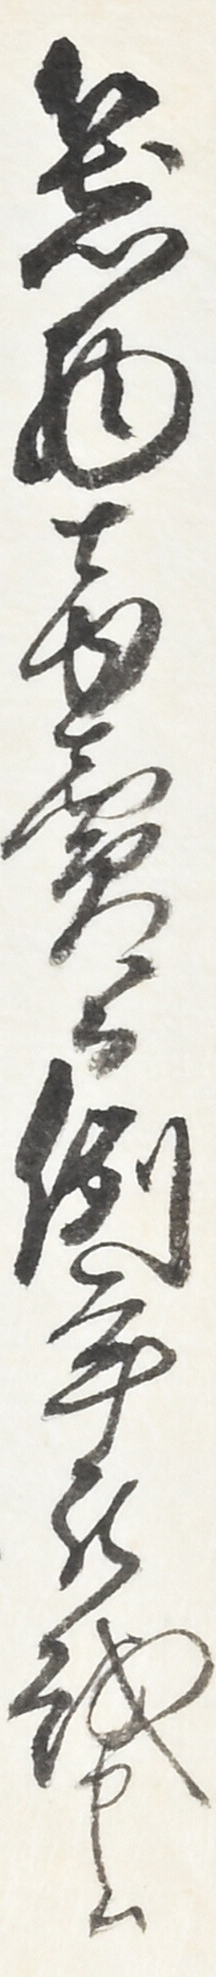絹商売ニ而例年罷越申候
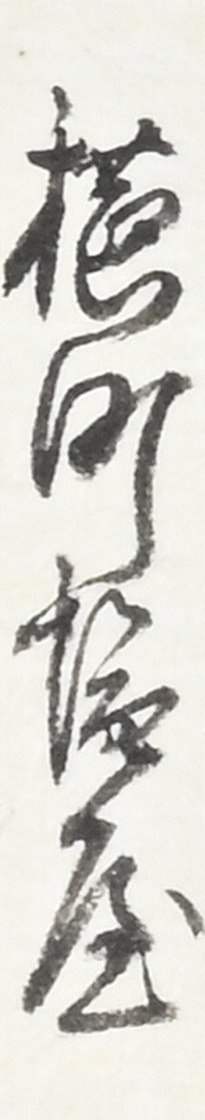横町塩屋
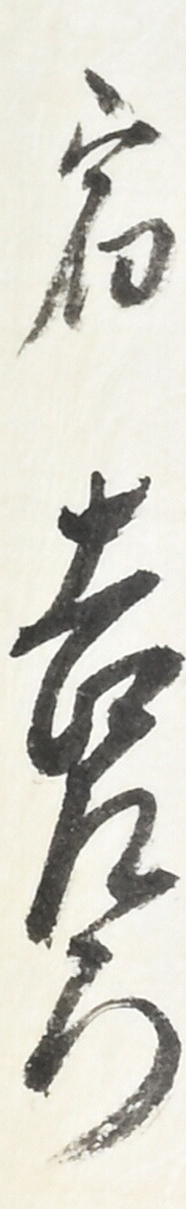宿吉左衛門
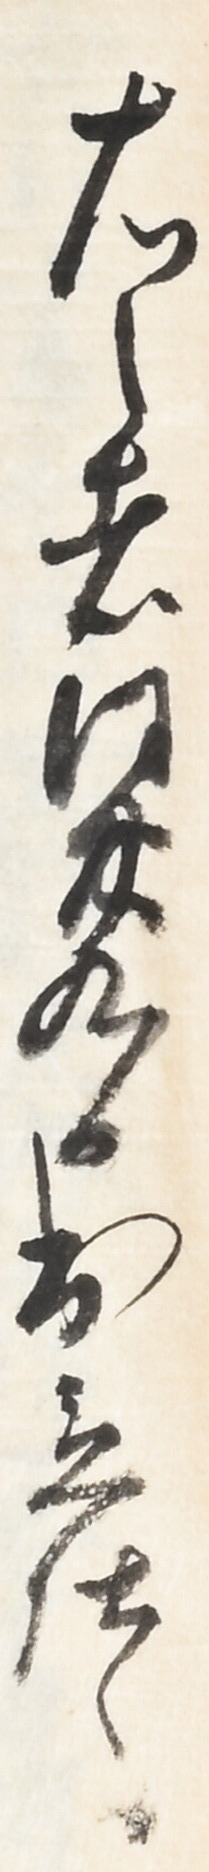右之者同十四日出立仕候
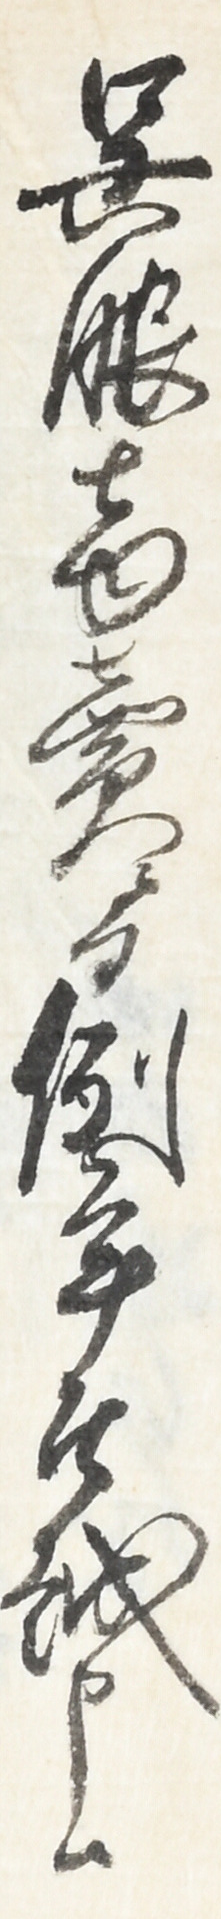絹商売ニ而例年罷越申候

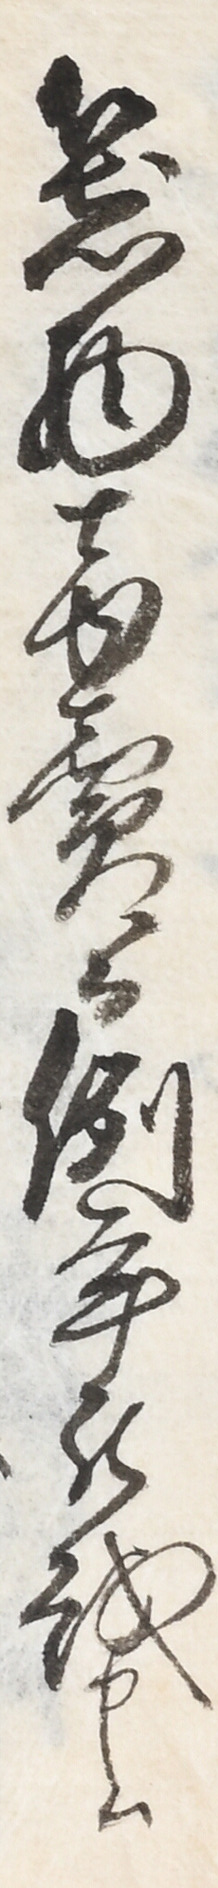呉服商売ニ而例年罷越申候
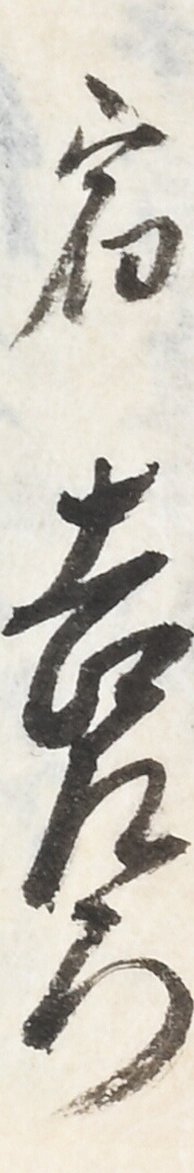宿金右衛門
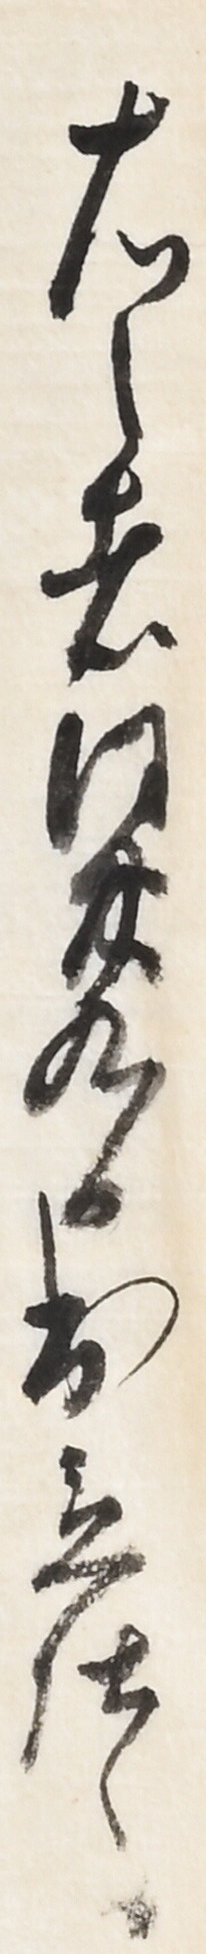右之者同廿九日出立仕候
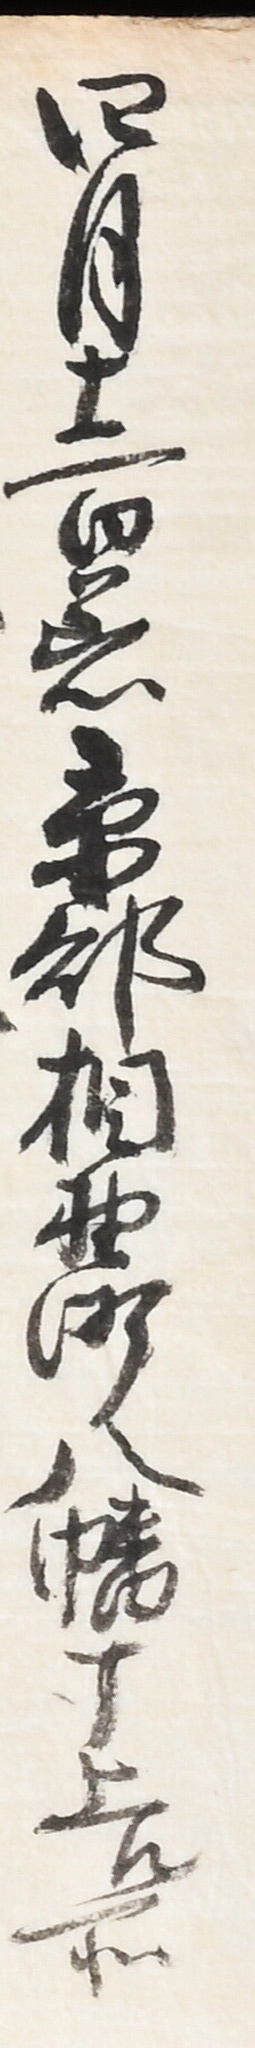四月十二日着京都相野町八幡丁上ル所
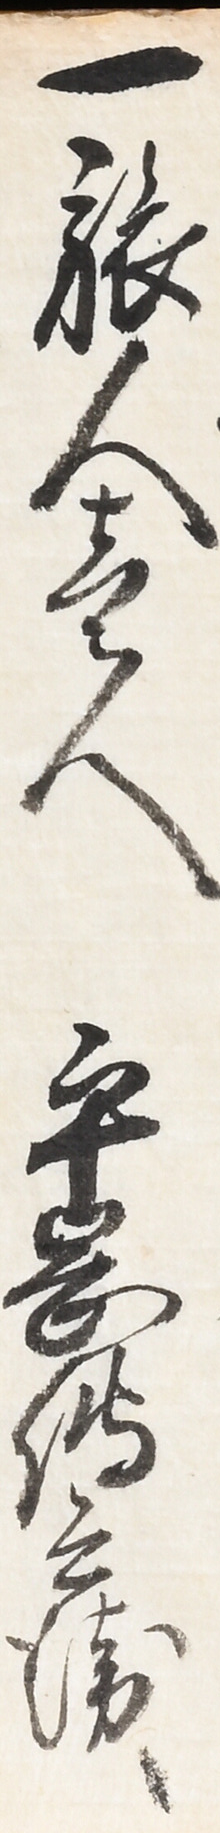一旅人壱人平岡伝兵衛・
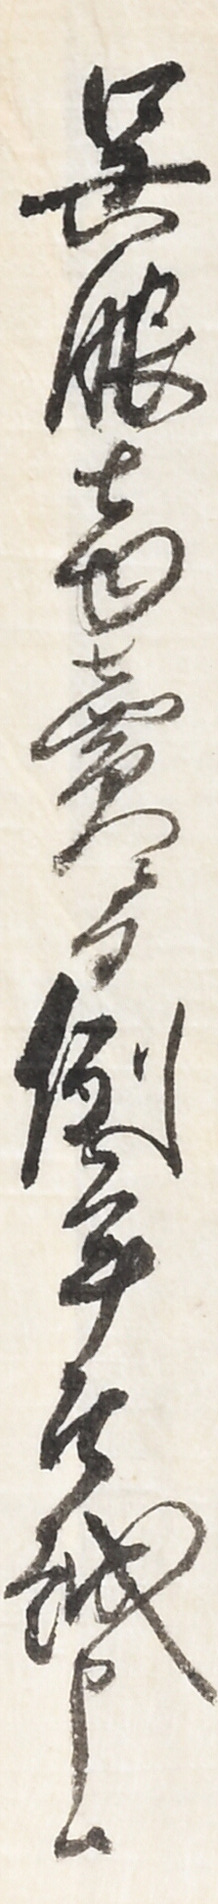呉服商売ニ而例年罷越申候
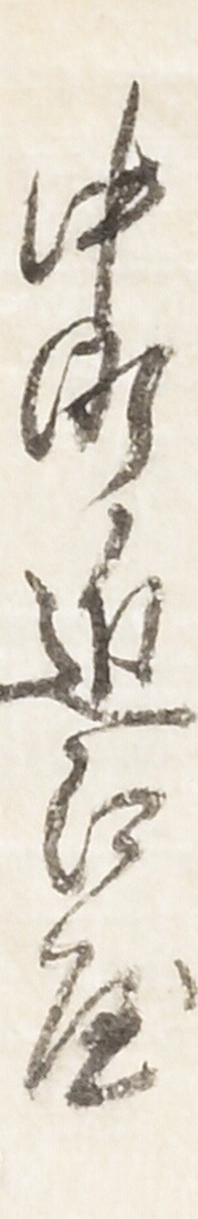中町近江屋
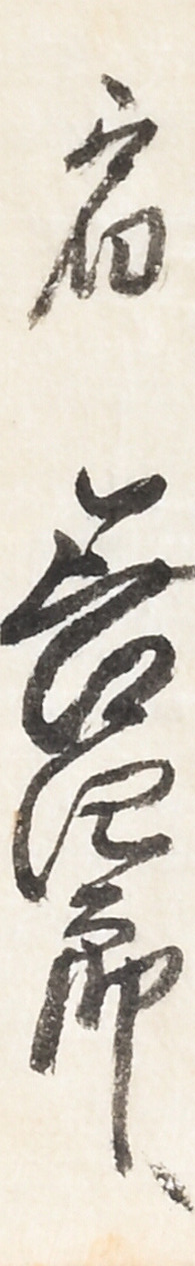宿善四郎
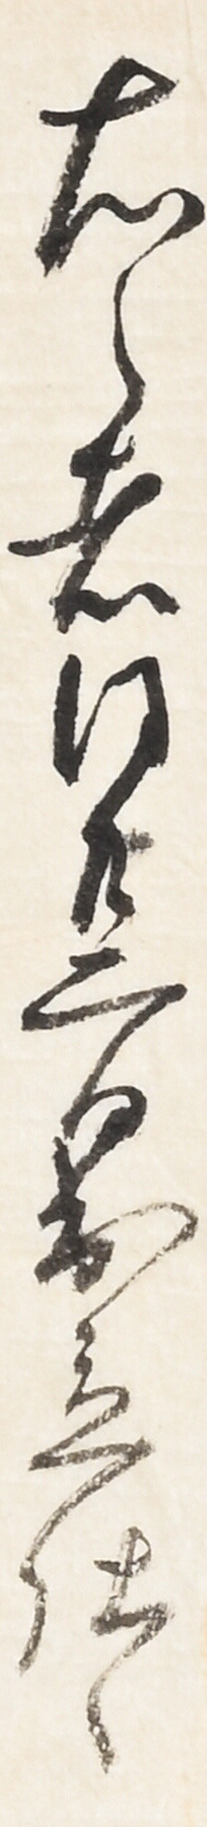右之者同廿二日出立仕候
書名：旅人泊控帳
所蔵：伊那市立高遠町図書館・合同会社AMANE
